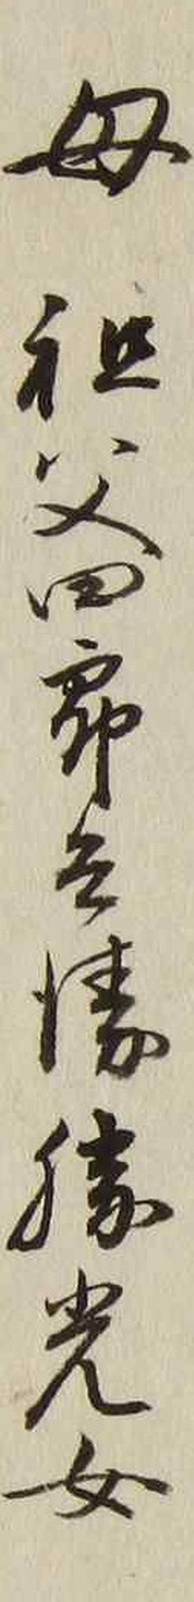母祖父四郎兵衛勝光女
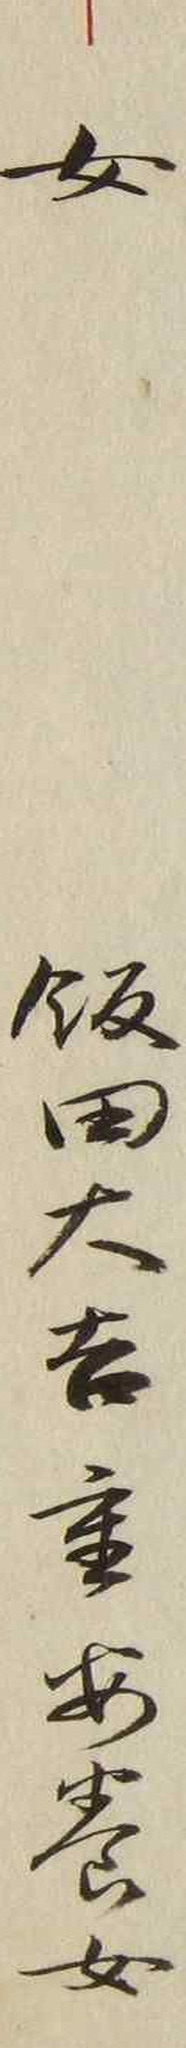女飯田大吉重安養女
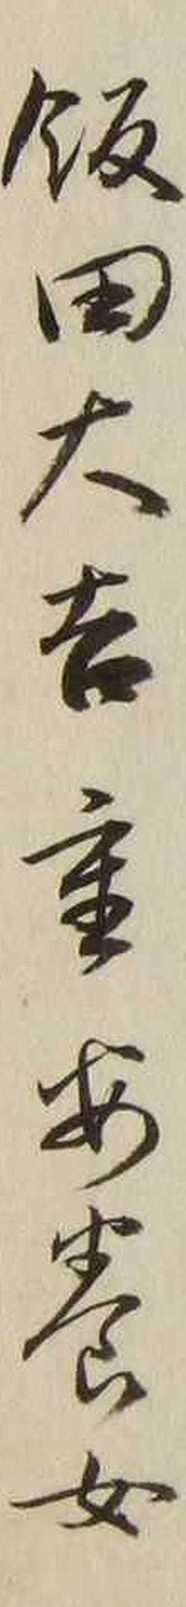女飯田大吉重安養女

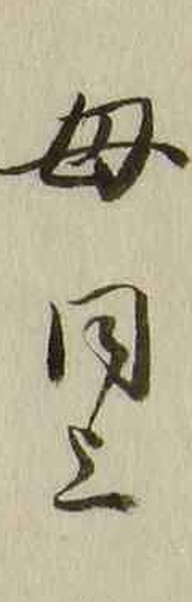母同上
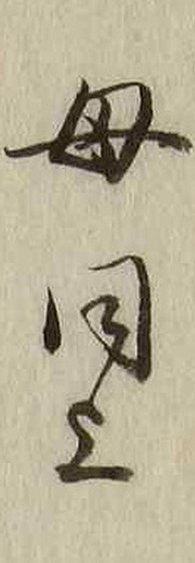母同上
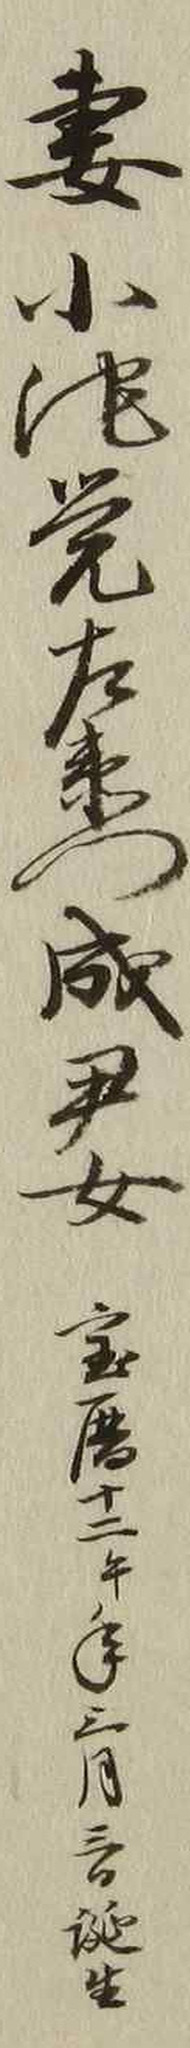妻小池覚左衛門成尹女宝暦十二午年三月三日誕生
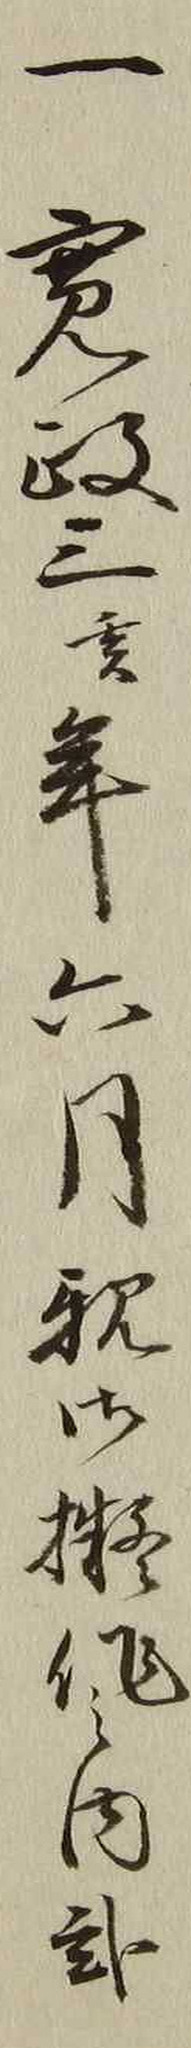一寛政三亥年六月親御擬作之内弐
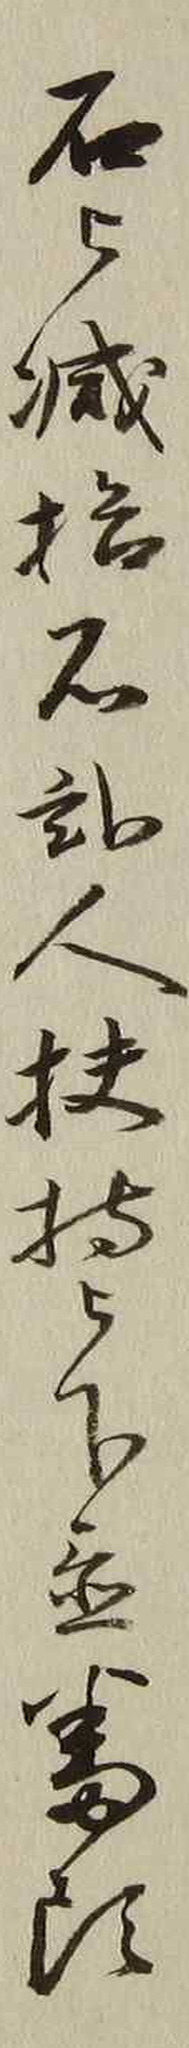石被減拾石弐人扶持被下置番頭
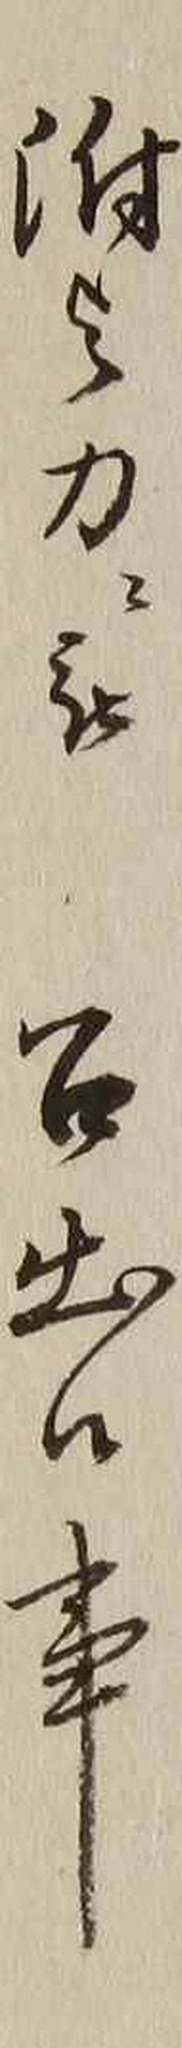附与力被召出候事
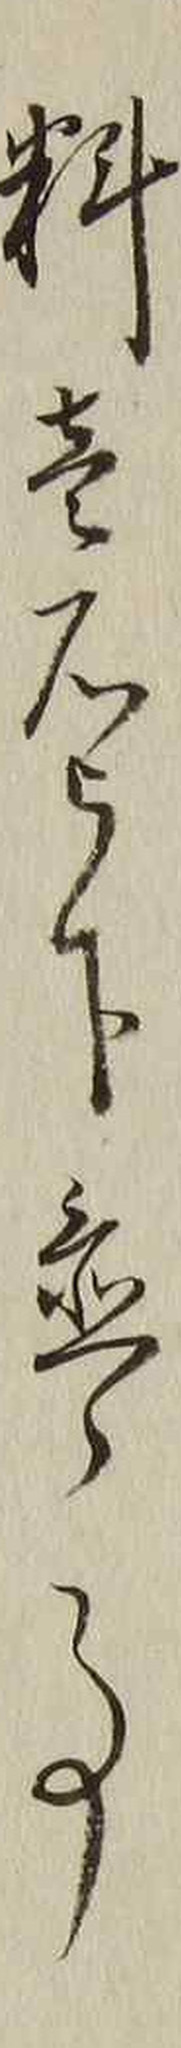料壱石被下置候事
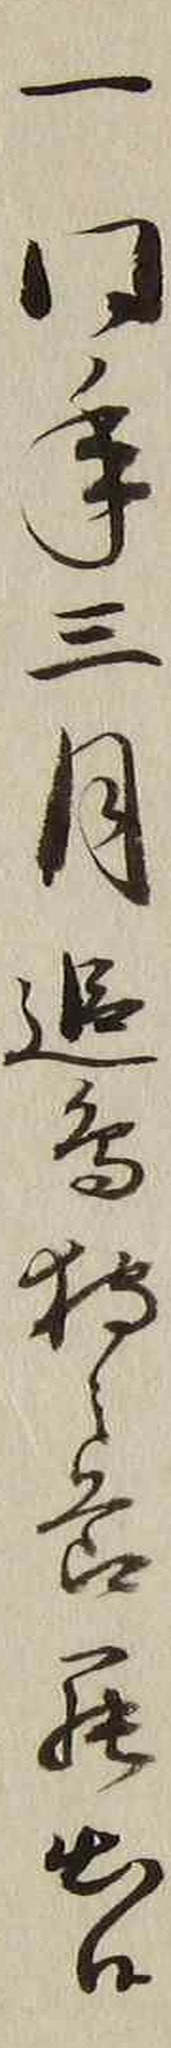一同年三月追鳥狩之節罷出候
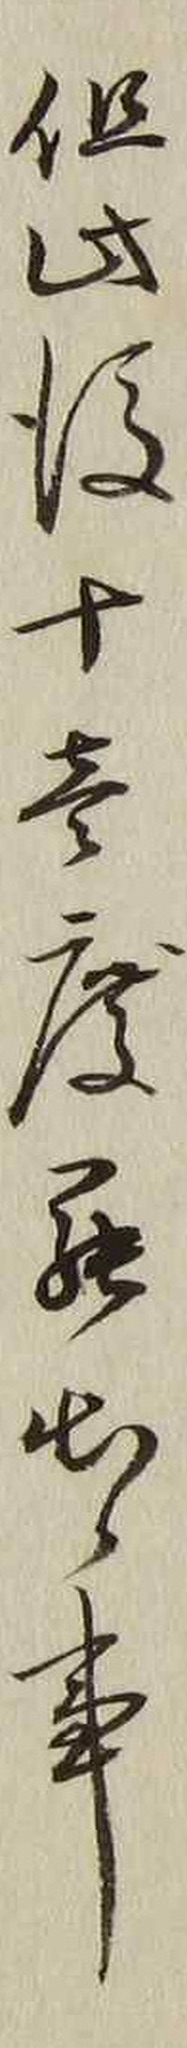但此後十壱度罷出候事
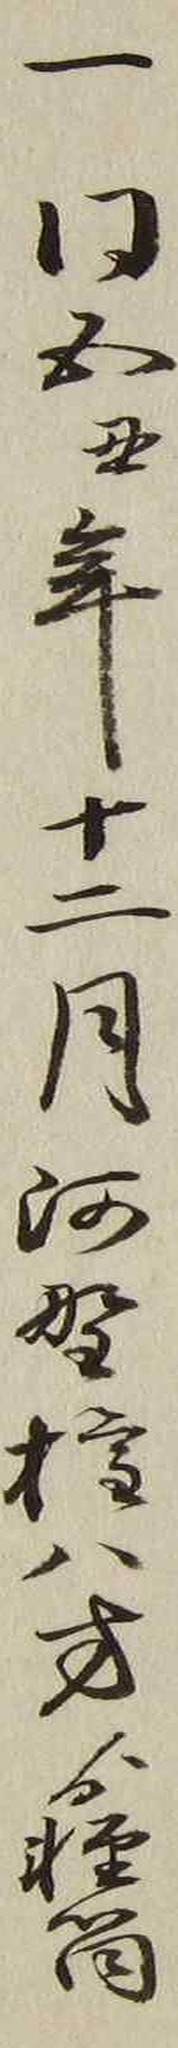一同五丑年十二月河野権八方ゟ軽筒
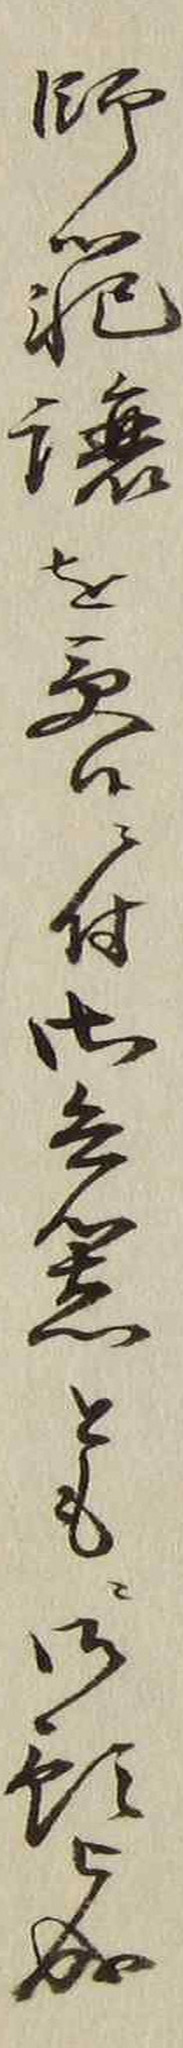師範譲を受候付御兵器とも御預被成

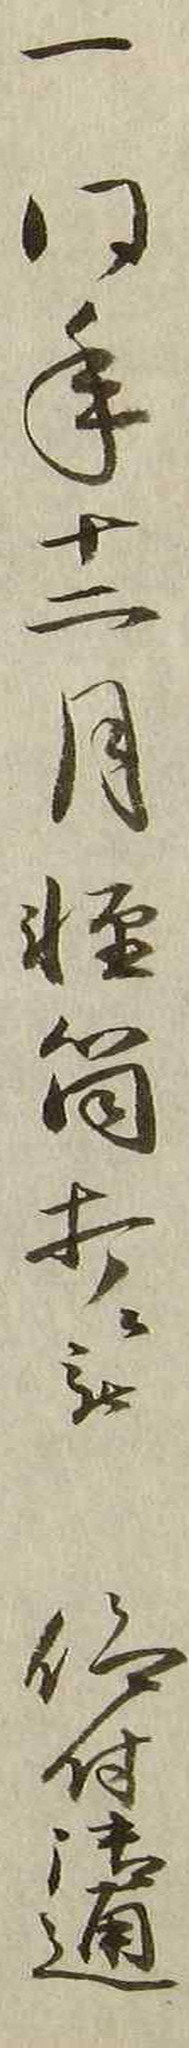一同年十二月軽筒打被仰付御通
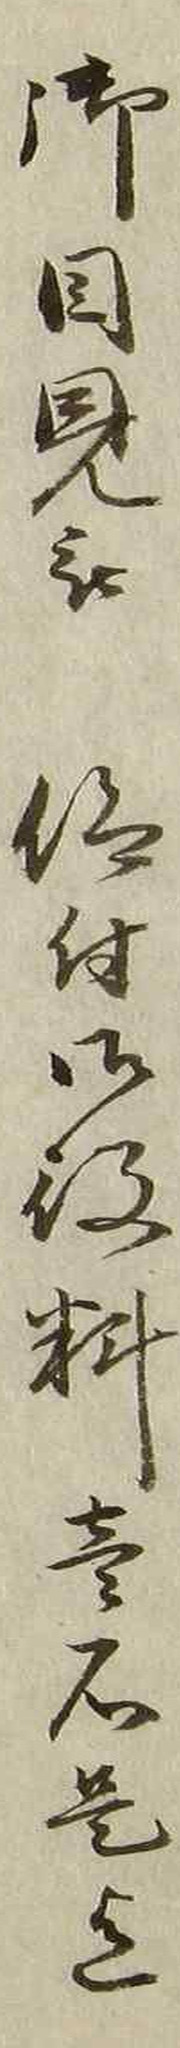御目見被仰付御役料壱石是迄
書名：諸士系譜　巻之102　か之部10
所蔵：会津若松市立会津図書館
